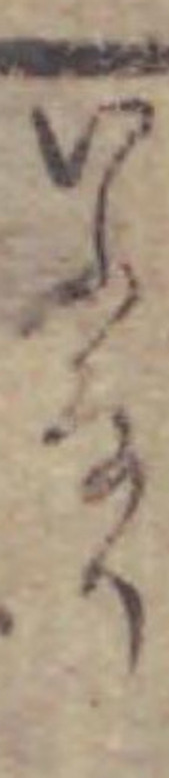いふなり
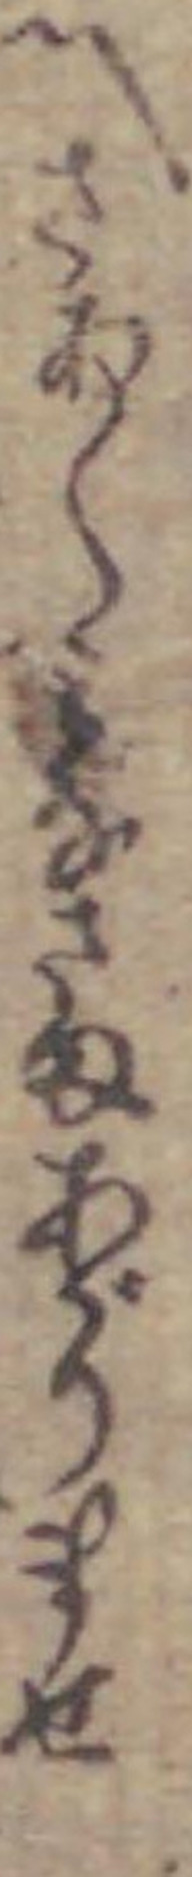〽さあ〳〵みなさまあがりませ
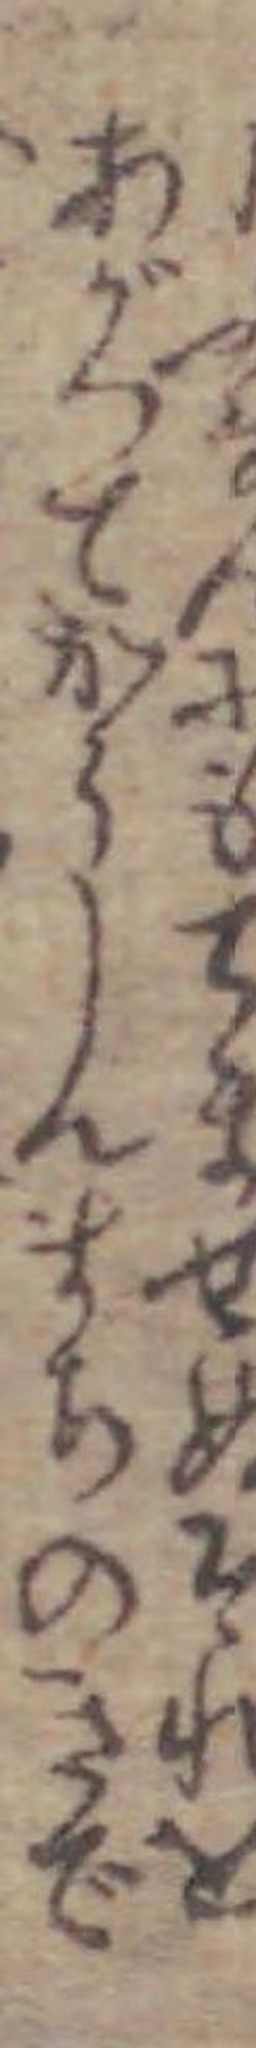あがつてかうしんまちのきで
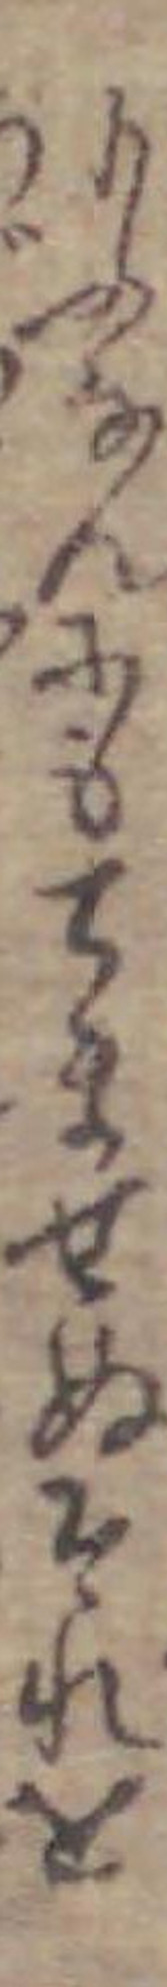もふなんにもてませぬそれを
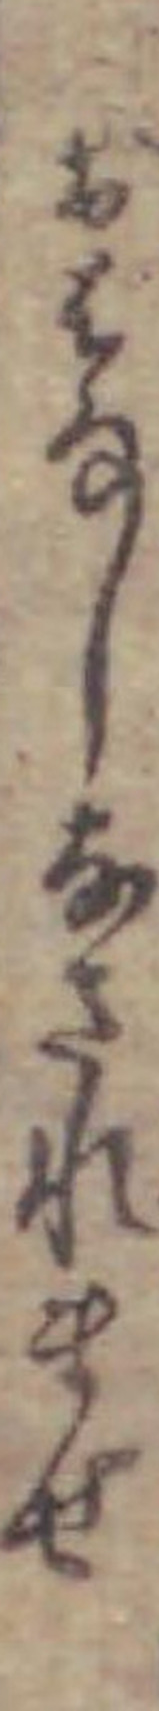おはなしなされまし

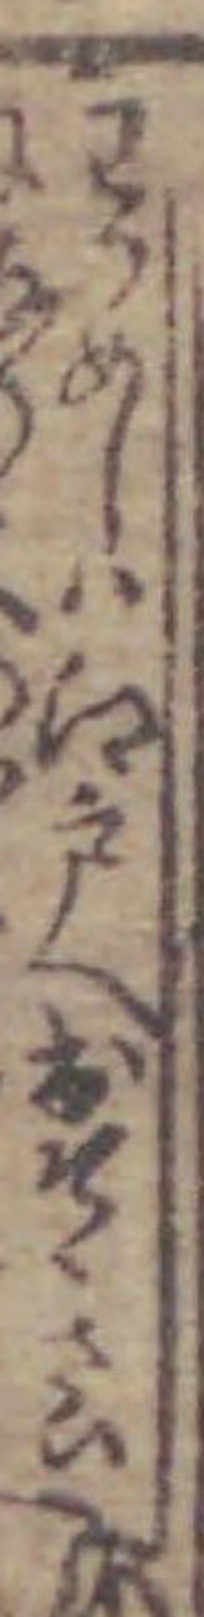わりめしは江戸へ出そくさい
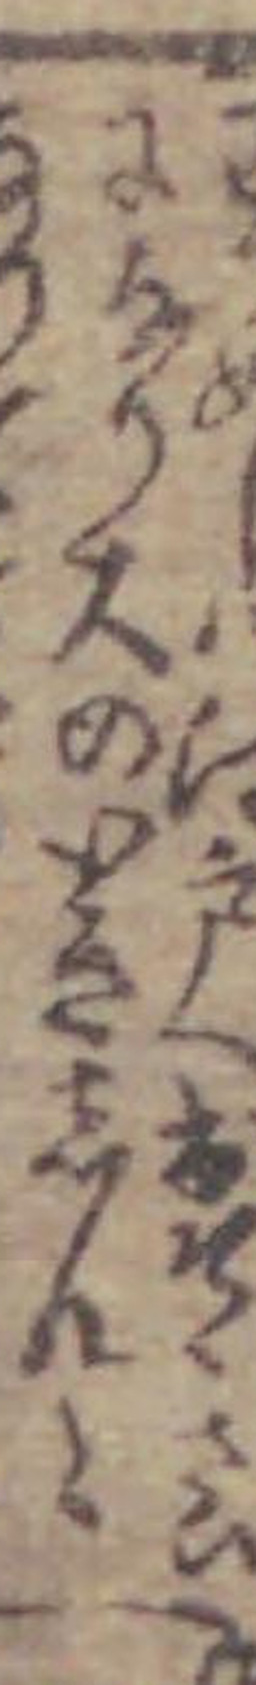になり大のいきしんと
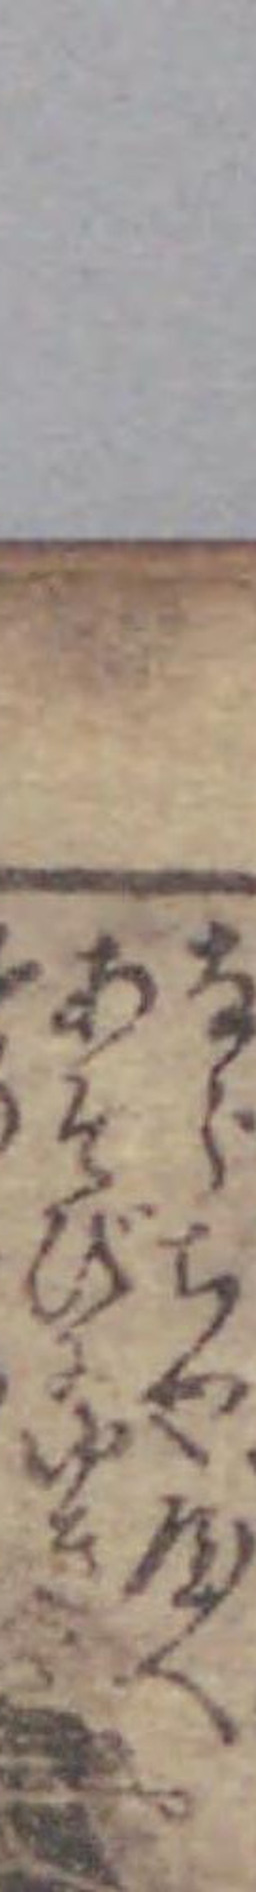あそびにゆき
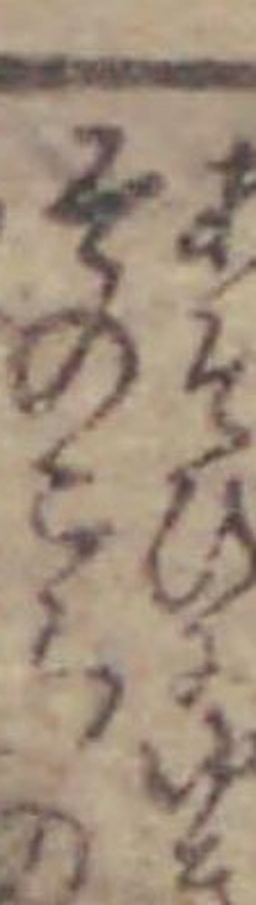そのころの
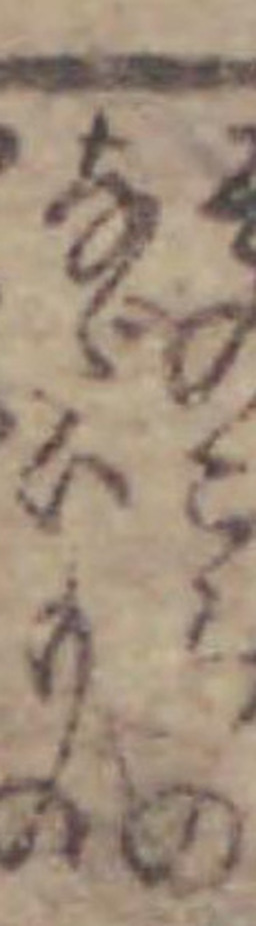なだいもの
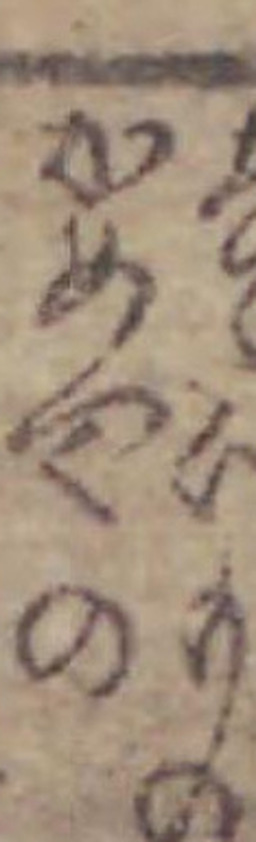かめやの
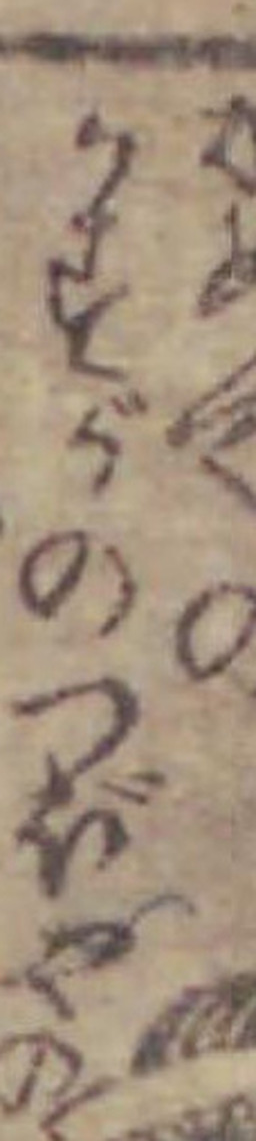かすがのつぼやの
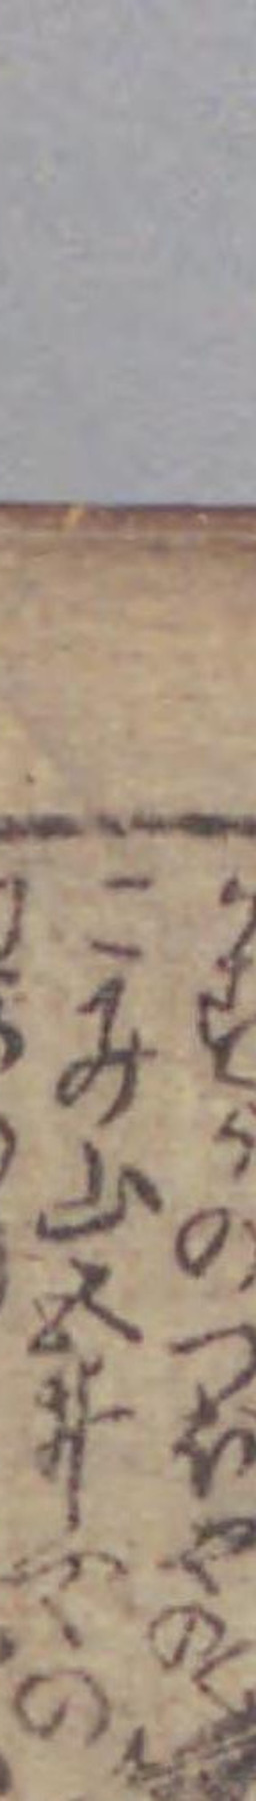こみ山五井やの
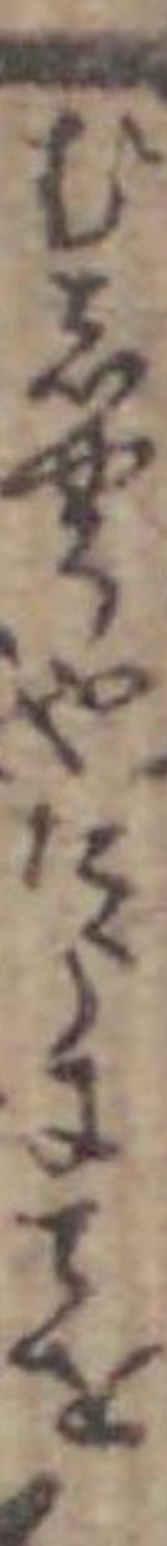むしやうやたらにてを
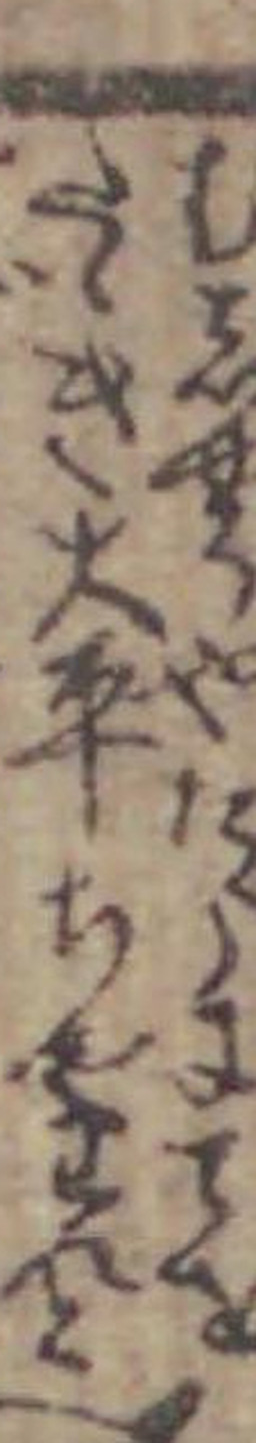たゝき太平ちやわんと
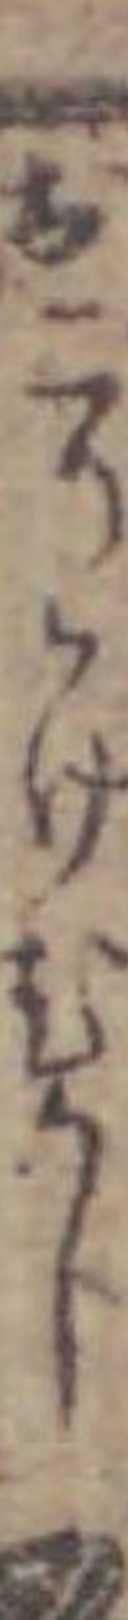おごりかけむかし
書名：諸事米の飯 : 3巻
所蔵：国立国会図書館 National Diet Library, JAPAN
